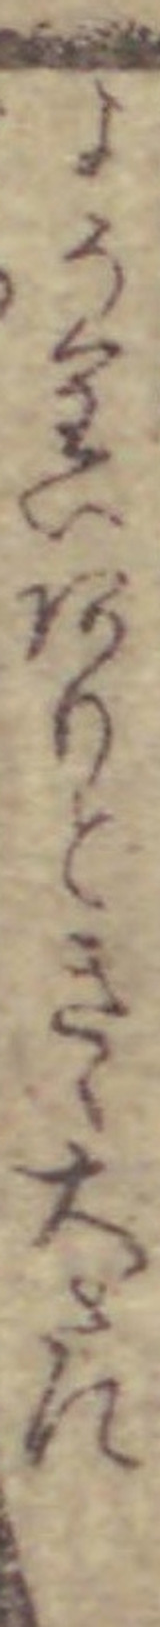ようくわいありときゝ大きに

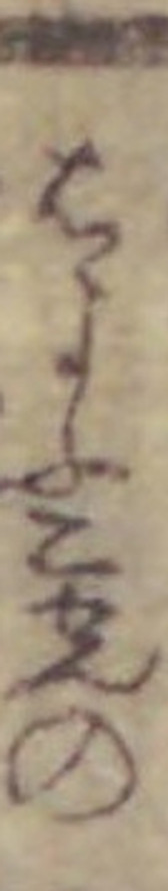はよふこせんの
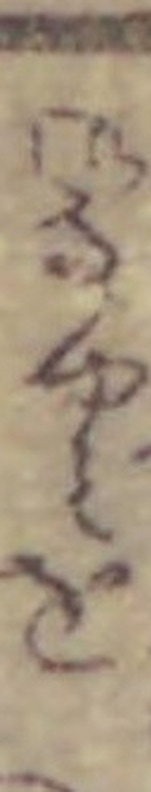御なやみを
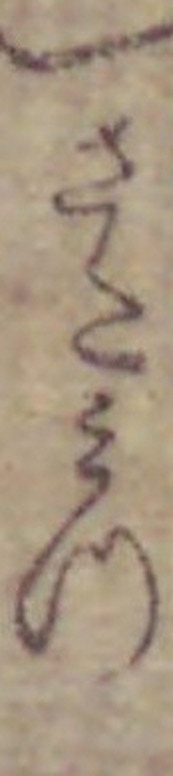さたみつ
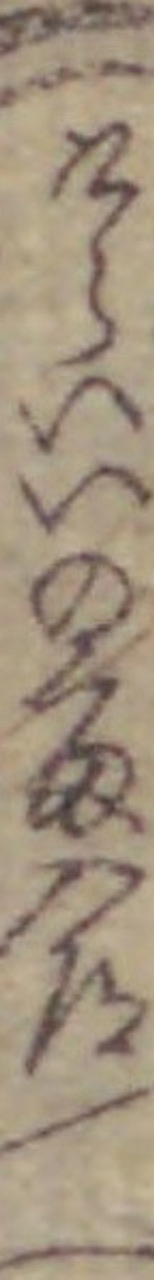けらいいのくま入道
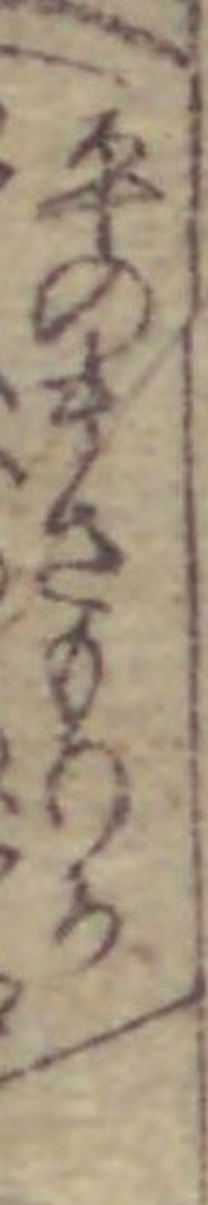平のまさもりか
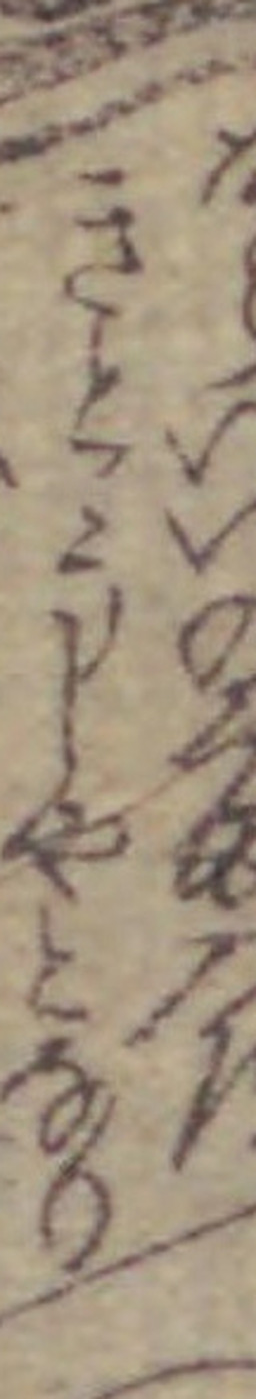きとうしやとなり
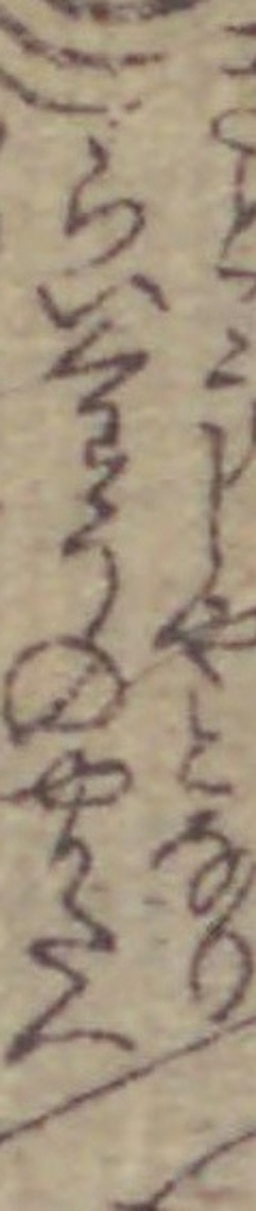らいくわうのやかたへ
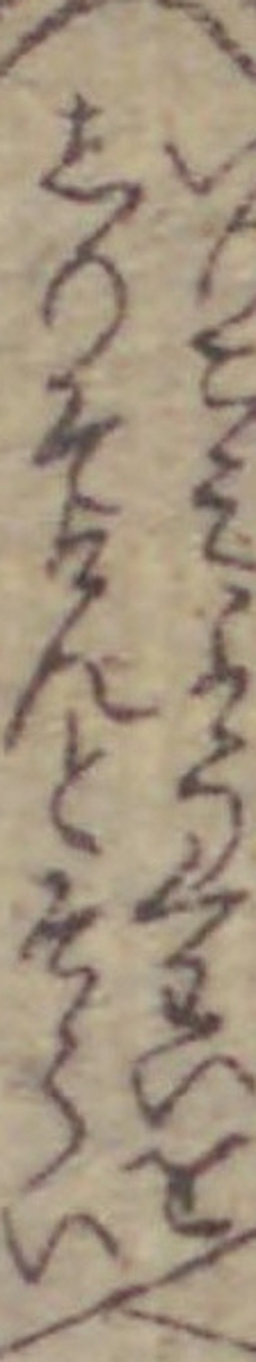しりそけんとそらい
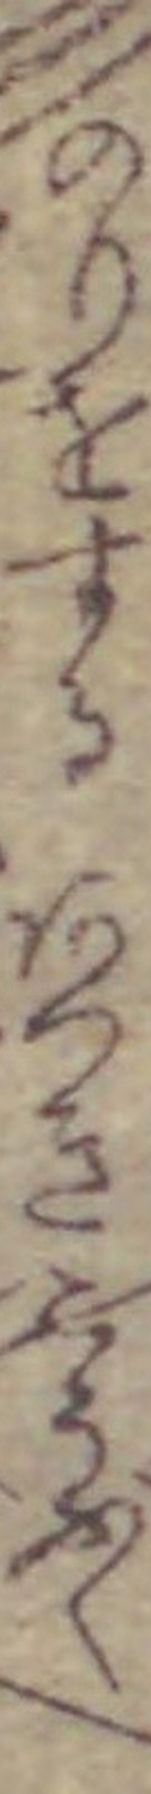のりをするあつきこうぶく
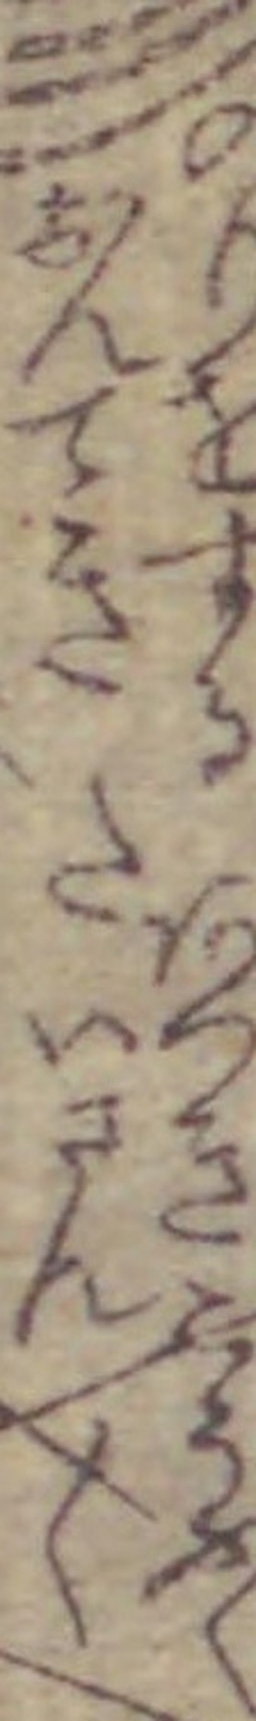おんてきたいさん〳〵

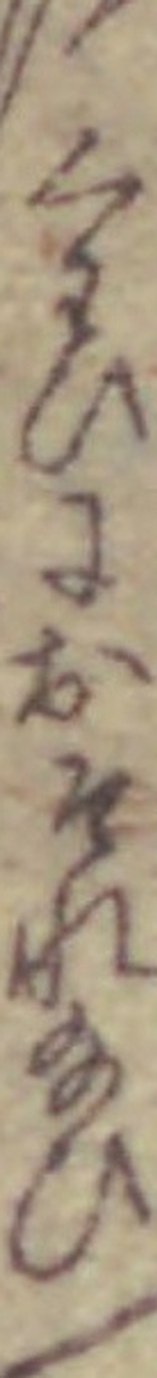くわひにおそれ給ひ
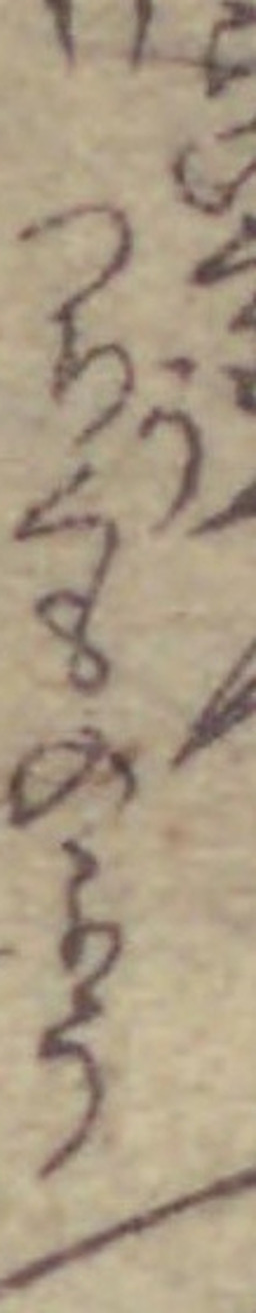つちくものよう
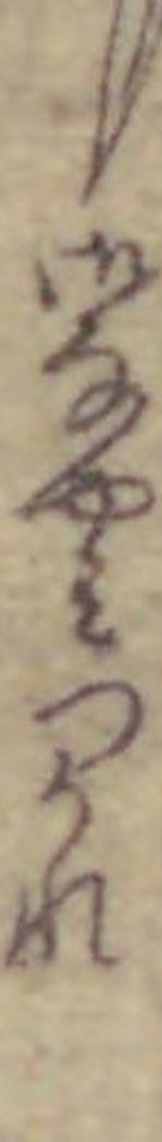御なやみつかれ
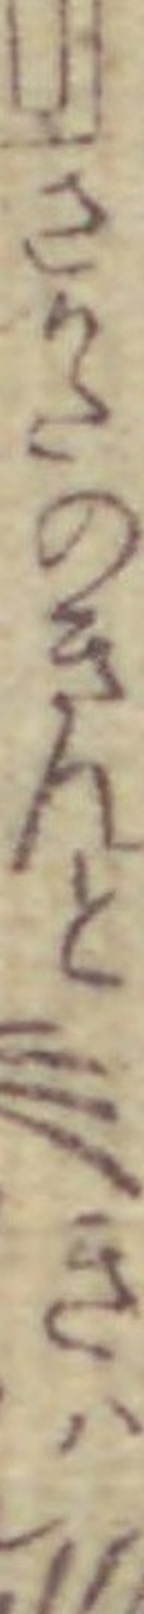さかたのきんときは
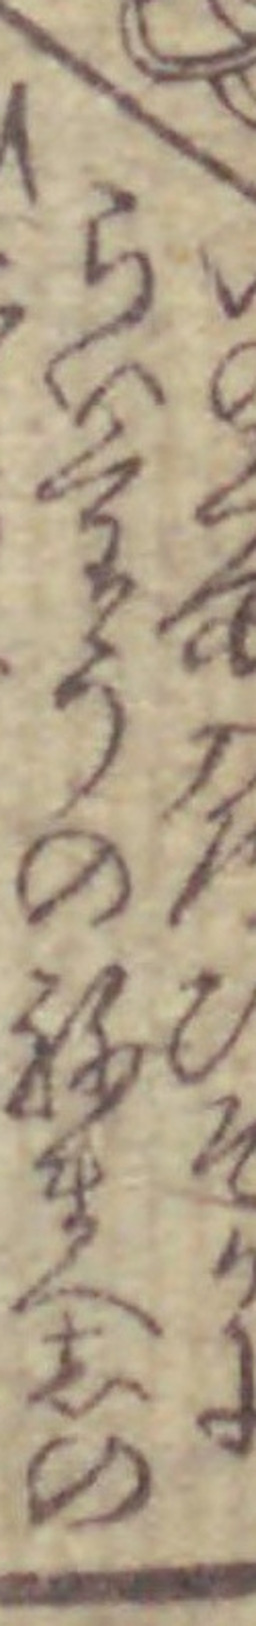らいくわうのねまへしの
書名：とんだ茶釜 2巻
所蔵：国立国会図書館 National Diet Library, JAPAN
